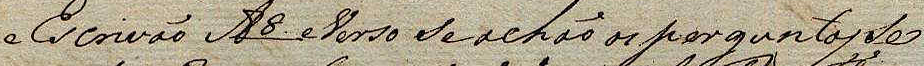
e Escrivaõ Af 8 e verso se achaõ as perguntas se
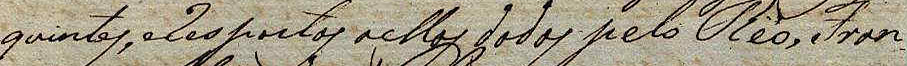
guintes, e respostas a ellas dadas pelo Réo, Fran
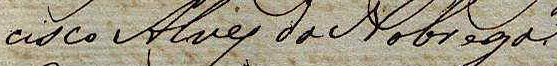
cisco Alves da Nobrega
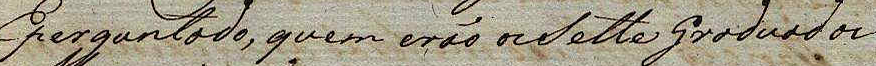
E perguntado, quem eraõ os sette graduados
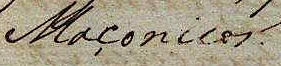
Maçonicos?
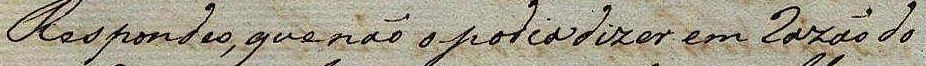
Respondeo, que naõ o podia dizer em razaõ do
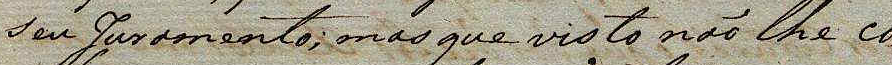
seu Juramento, mas que visto naõ lhe co
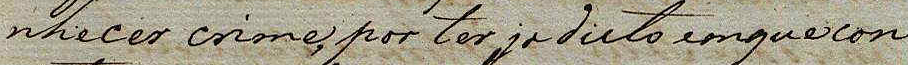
nhecer crime, por ter ja dicto em que con
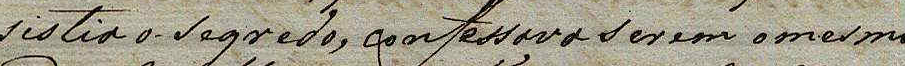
sistia o segredo, confessava serem o mesmo
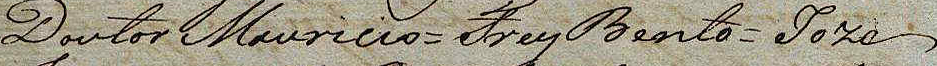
Doutor Mauricio = Frey Bento = Joze
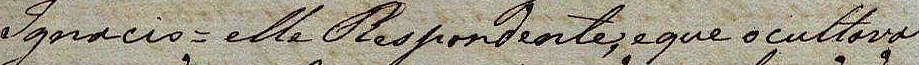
Ignacio = elle Repondente, e que ocultava
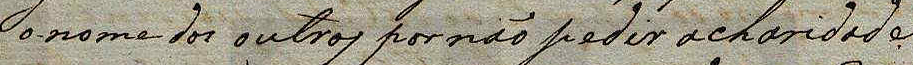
o nome dos outros por naõ pedir a charidade
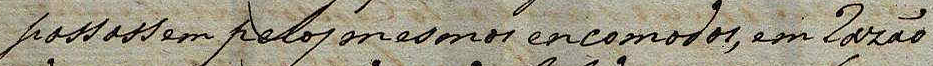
passassem pelos mesmos encomodos, em razaõ
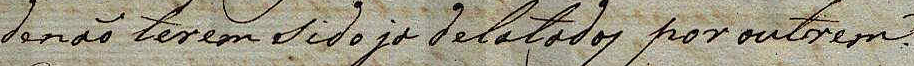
de naõ terem sido ja delatados por outrem.
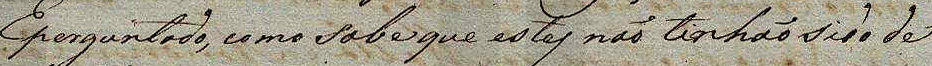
E perguntado, como sabe que estes naõ tinhaõ sido de
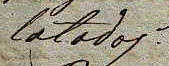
latados?
